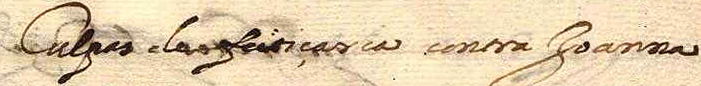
Culpas de feitiçaria contra Joanna
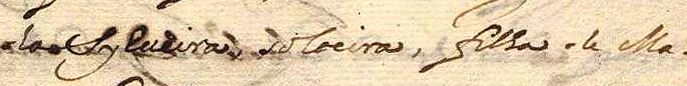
da Sylueira solteira, filha de Ma
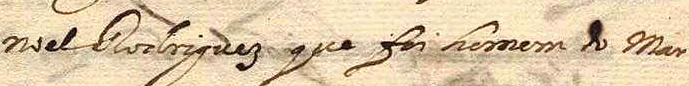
noel Rodriguez que foi homem do mar
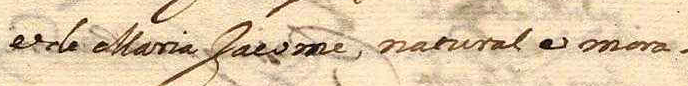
e de Maria Jacome, natural e mora
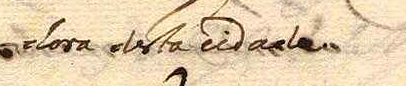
dora desta cidade.
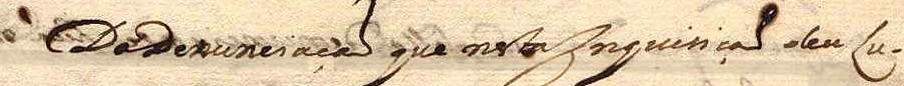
Da denunciaçaõ que nesta Inquisiçaõ deu Lu
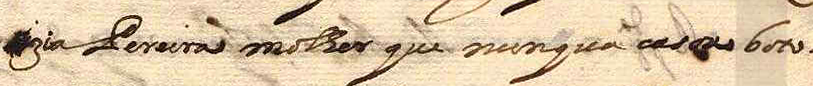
zia Pereira molher que nunqua casou boto
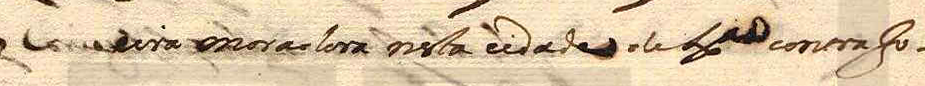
eira moradora nesta cidade de Lxa contra Jo
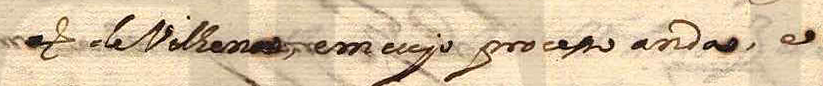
aõ de Vilhena, em cujo processo andao, e
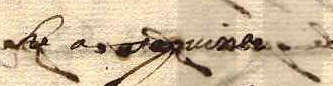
he a seguinte.
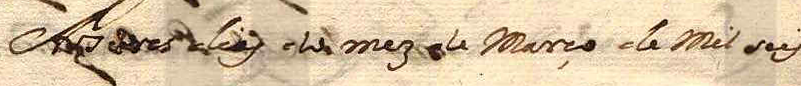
Aos tres dias do mez de março de mil seis
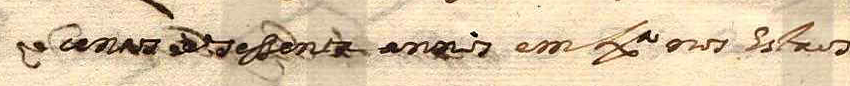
centos e sessenta annos em Lxa nos Estaos
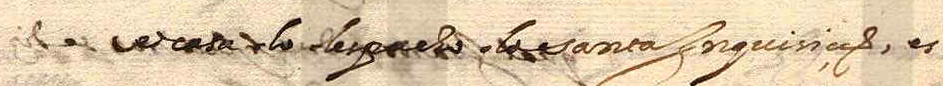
e casa do despacho da santa Jnquisiçaõ, es
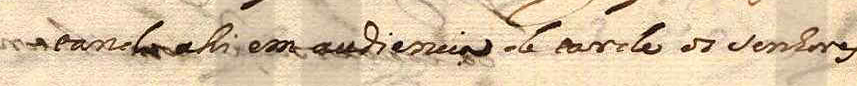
tando ahi em audiencia de tarde os senhores
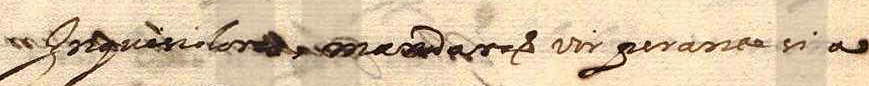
Jnquisidores, mandaraõ vir perante si a
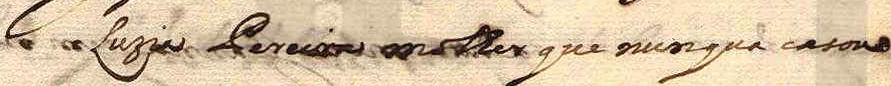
Luzia Pereira molher que nunqua casou
